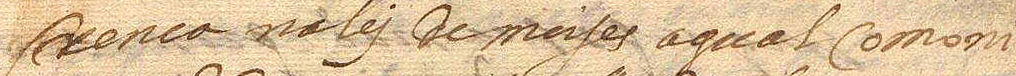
Crença na lej de Moises a qual Comoni
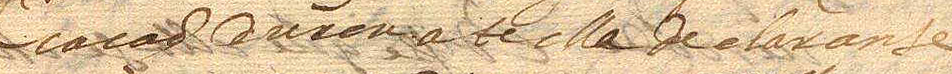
caçaõ durou ate ella declarante
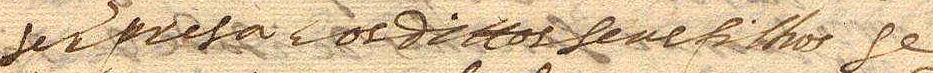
ser presa e os dittos seus filhos se
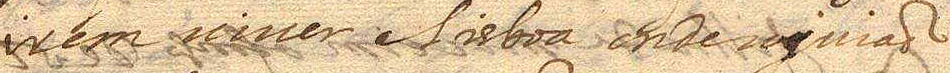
irem uiuer a lisboa onde uiuiaõ
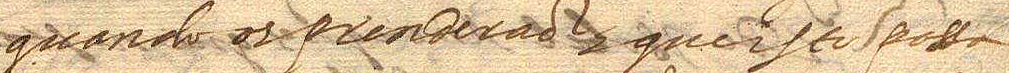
quando os prenderaõ e que isto passa
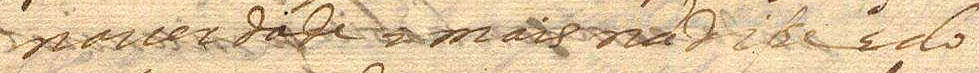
na uerdade e mais naõ disse e do
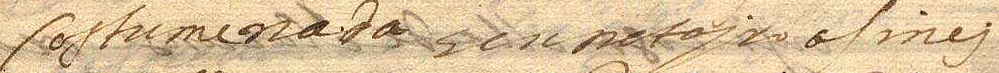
Costume nada e eu notajro asinej
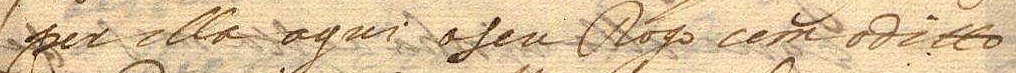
per ella aqui a seu Rogo com o ditto
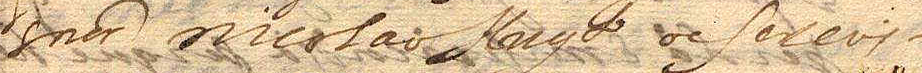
snor̄ nicolao Augto o escrevj
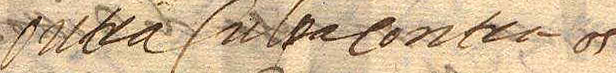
outra Culpa contra os
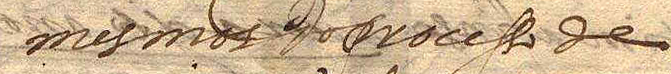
mesmos do pocesso de
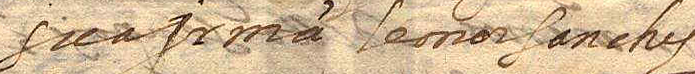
sua jrmã Leonor Sanches
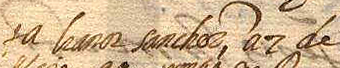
ta leanor sanchez, a 7 de
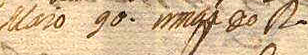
Maio 90. irmaã do R.
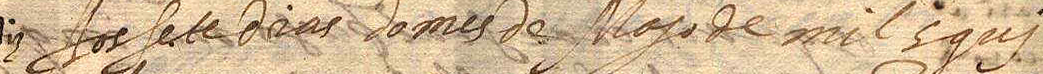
Aos sete dias do mes de Majo de mil E quj
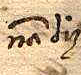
nā diz
